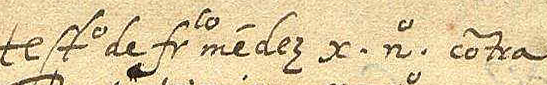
testo de frco mēdez x. no. cōtra
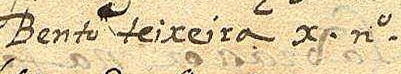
Bento teixeira x. no.
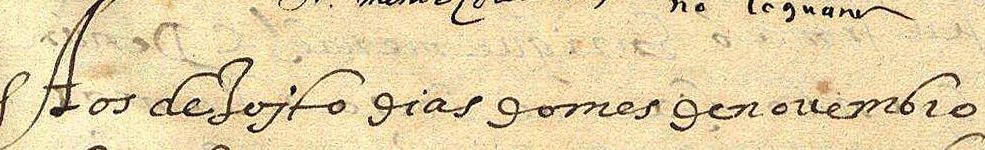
Aos dezojto dias do mes de nouembro
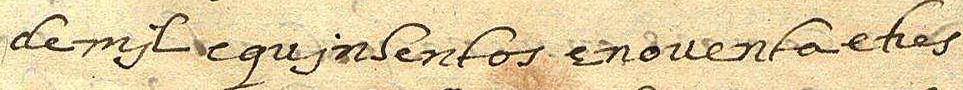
de mjl e qujnhentos E nouenta e tres
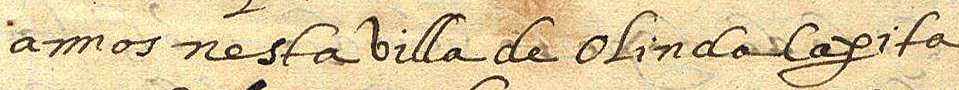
annos nesta villa de OLinda Capita
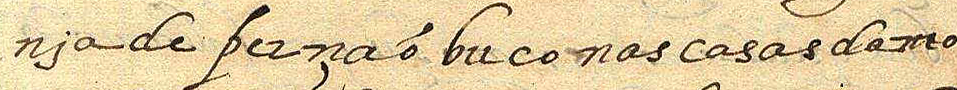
nia de Pernaõbuco nas casas da mo
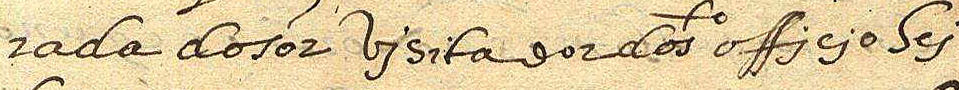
rada do sōr vjsitador do sto offjcjo hej
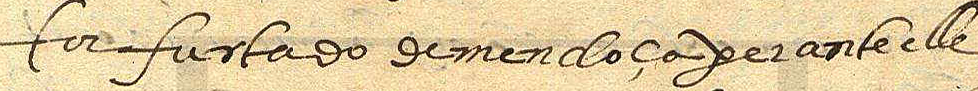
tor furtado de mendoça perante elle
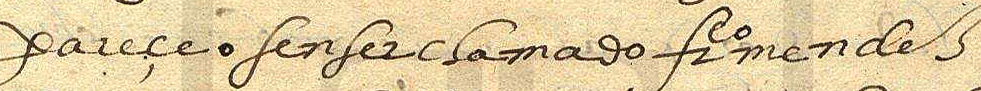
pareçeo sen ser chamado frco mendez
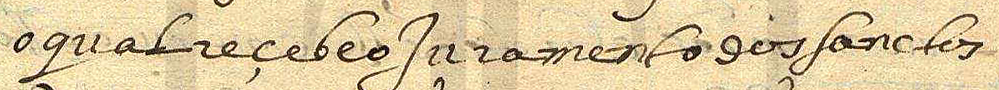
o qual reçebeo Juramento dos sanctos
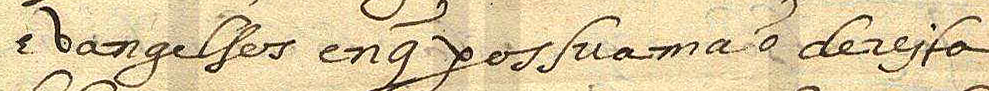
Evangelhos en q̄ pos sua maõ derejta
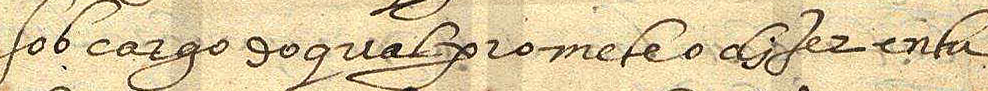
sob cargo do qual prometeo djzer en tu
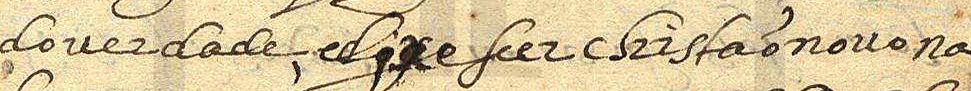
do uerdade, e djxe seer christaõ nouo na
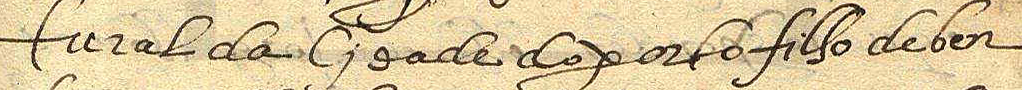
tural da Cjdade do porto filho de ben
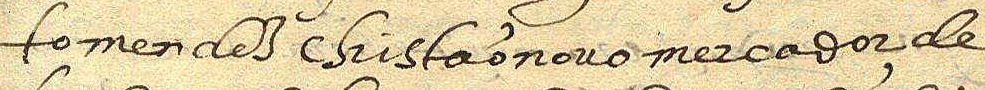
to mendez christaõ nouo mercador de
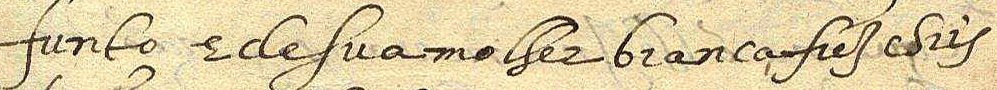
funto E de sua molher branca frez̄ chris
